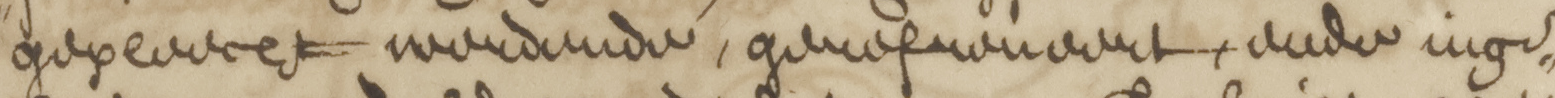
gepleecht werdende, gerefreneert, ende inge,,
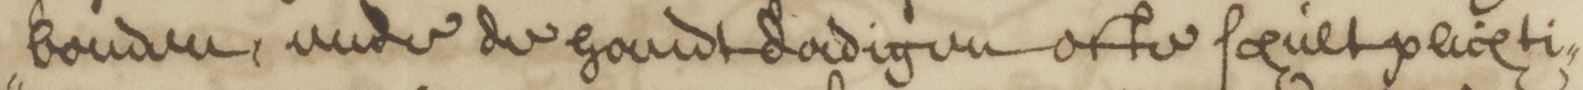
,,bonden, ende de handtdadigen ofte schultplichti,,
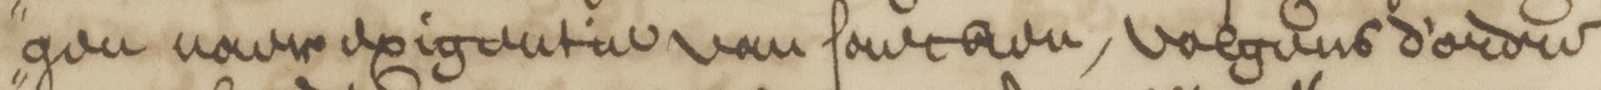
,,gen naer exigentie van saecken, volgens d'ordre
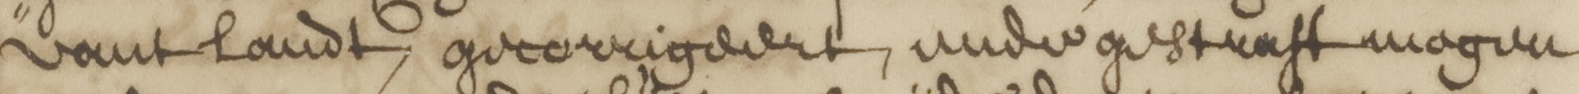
vant Landt, gecorrigeert, ende gestraft mogen
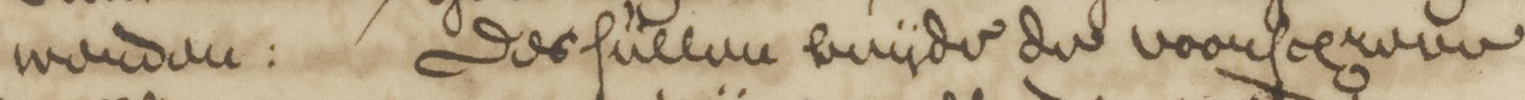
werden: Des sullen beijde de voorschreve
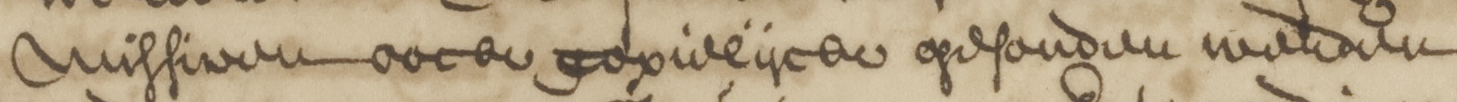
Missiven oock gepielijck gesonden werden
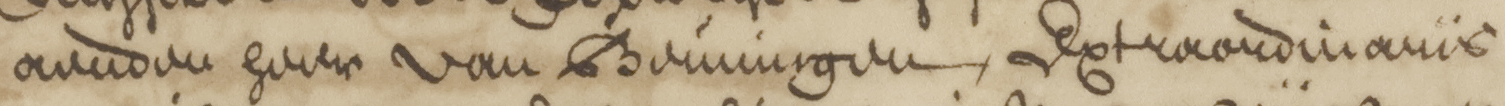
aenden heer van Beuningen, Extraordinaris
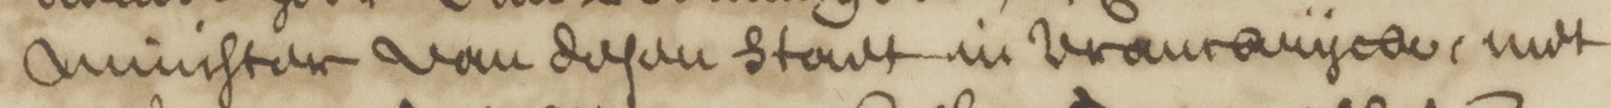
Minister van desen Staet in Vranckrijck, met
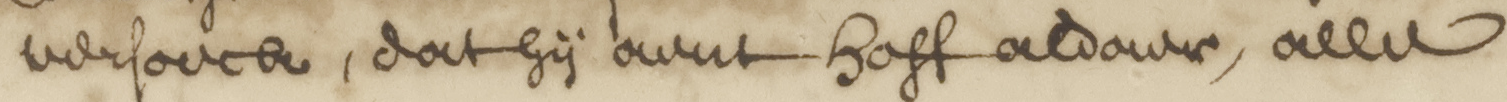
versoeck, dat hij aent hoff aldaer, alle
